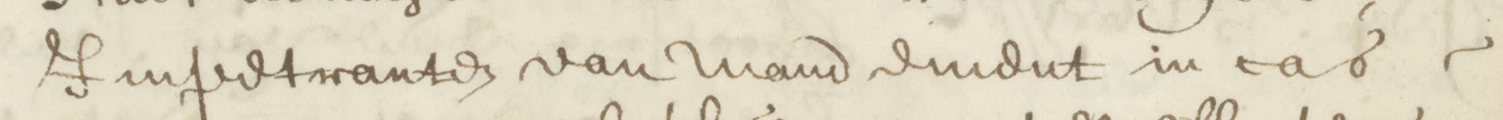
Impetranten van mandement in cas
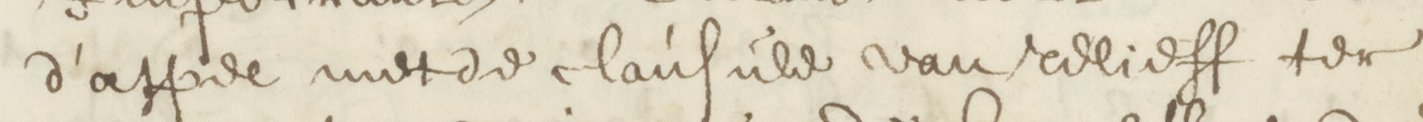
d'appel met de clausule van relieff ter
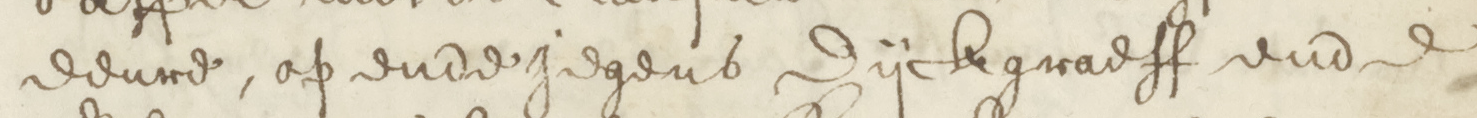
eenre, op ende jegens Dijckgraeff ende
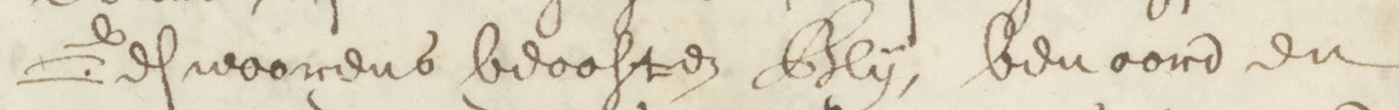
Geswoorens beoosten Blij, benoorden
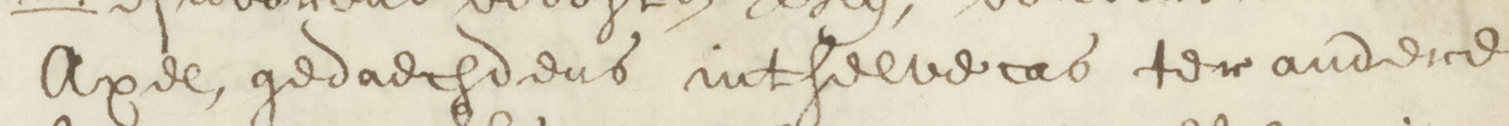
Axel, gedaechdens int selve cas ter andere
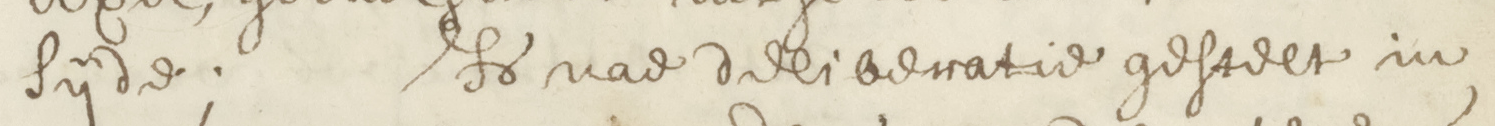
sijde; Is nae deliberatie gestelt in
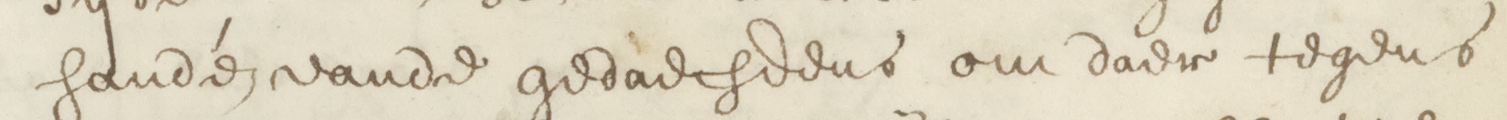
handen vande gedaechdens om daer tegens
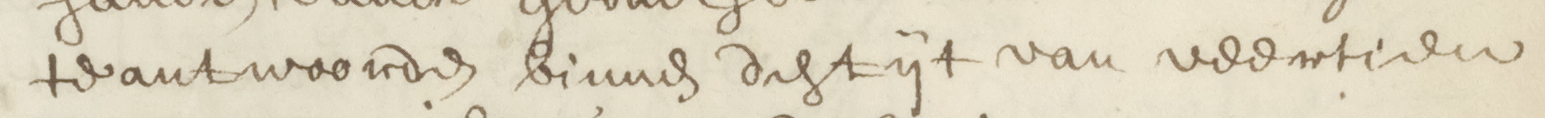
te antwoorden binnen den tijt van veertien
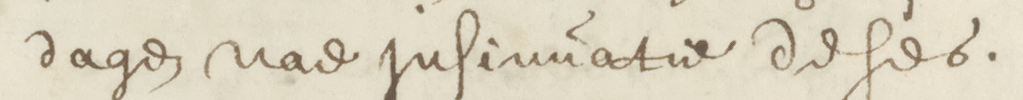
dagen nae insinuatie deses.
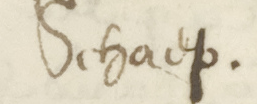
Schaep.
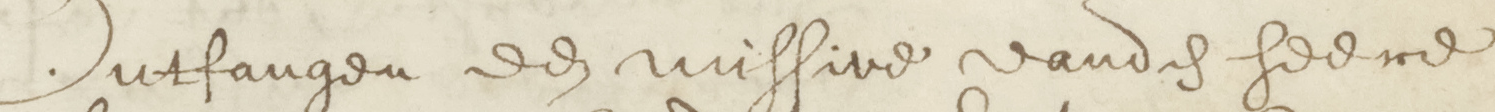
Ontfangen een missive vanden heere
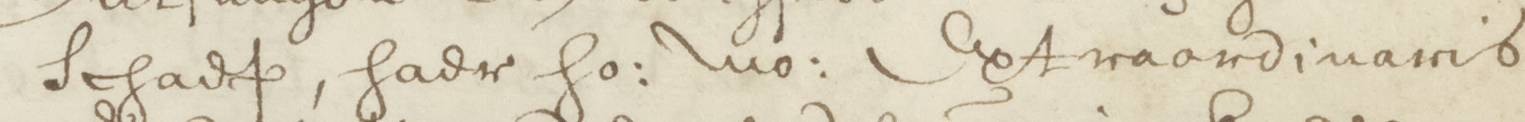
Schaep, haer Ho:Mo: Extraordinaris
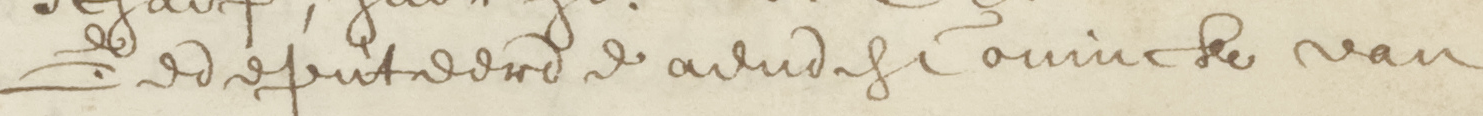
Gedeputeerde aenden Coninck van
